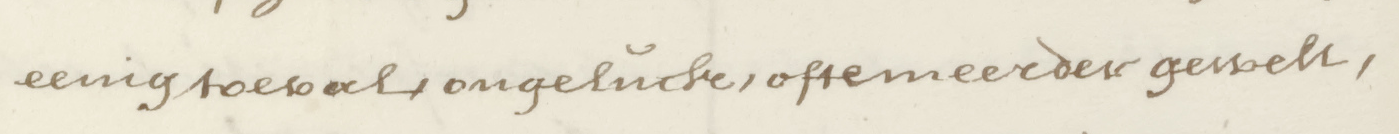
eenig toeval ongeluck, ofte meerder gewelt,
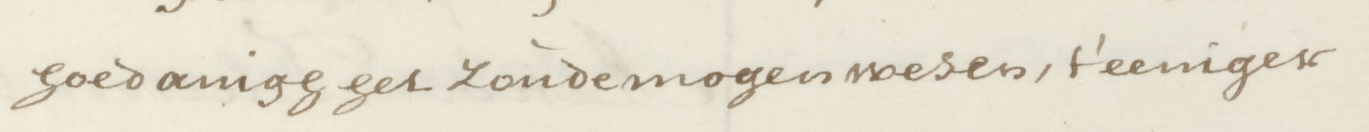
hoedanigh het zoude mogen wesen, t'eeniger
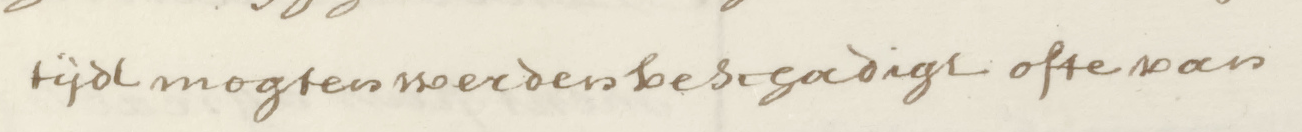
tijdt mogten werden beschadigt ofte van
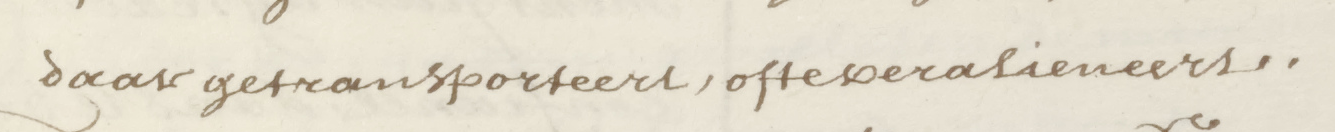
daar getransporteert, ofte veralieneert.
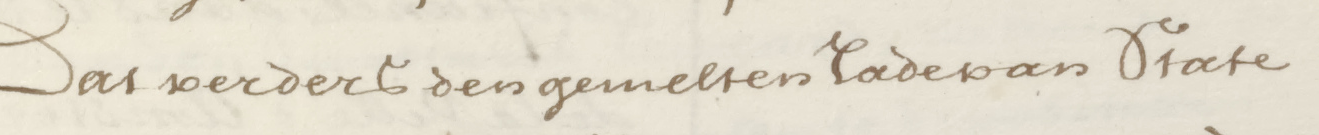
Dat verders den gemelten Rade van State
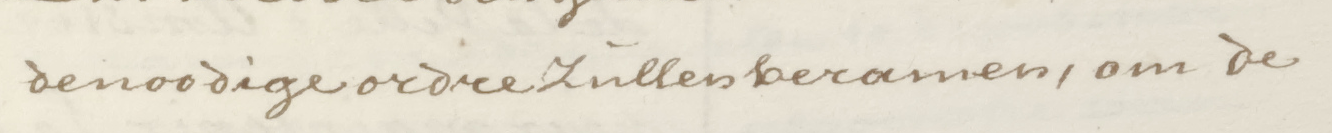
de noodige ordre zullen beramen, om de
